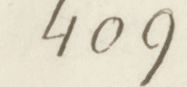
409
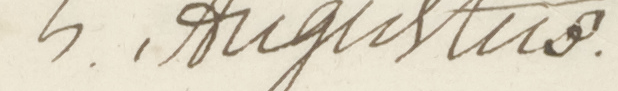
5. Augustus.
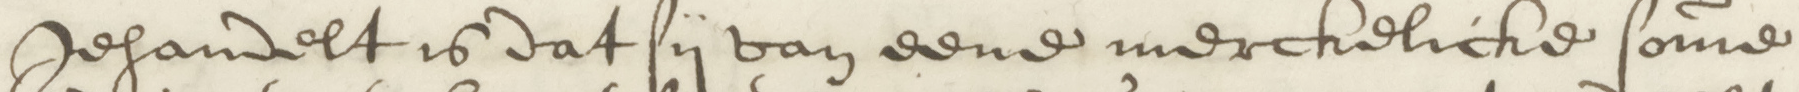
gehandelt is dat sij van eene merckelicke some
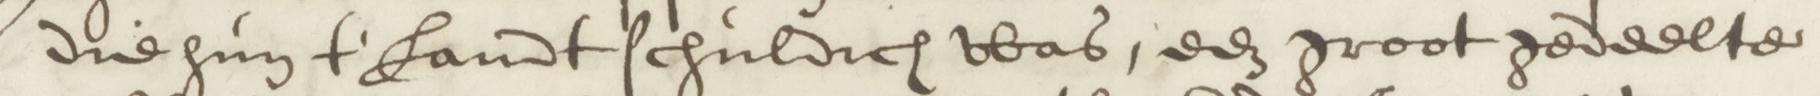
die hun t'Landt schuldich was, een groot gedeelte
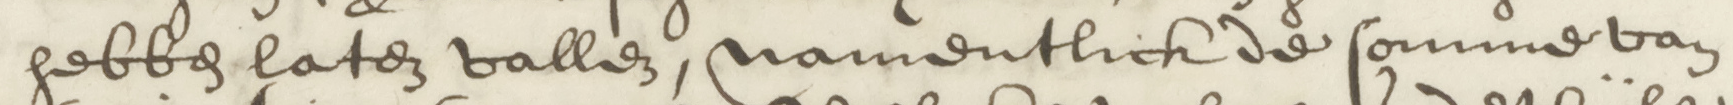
hebben laten vallen, namentlick de somme van
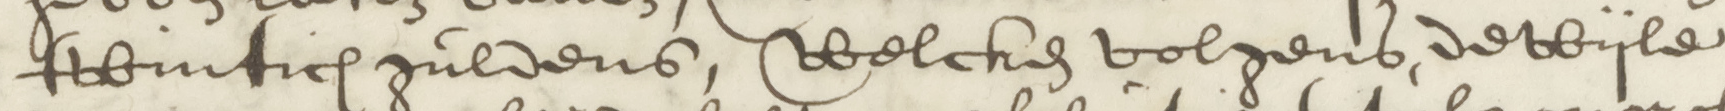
twintich guldens, welcken volgens dewijle
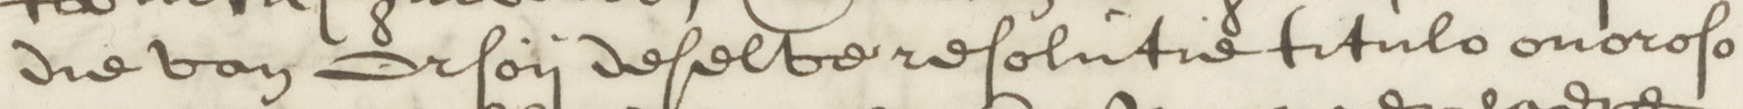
die van Orsoij deseve resolutie titulo onoroso
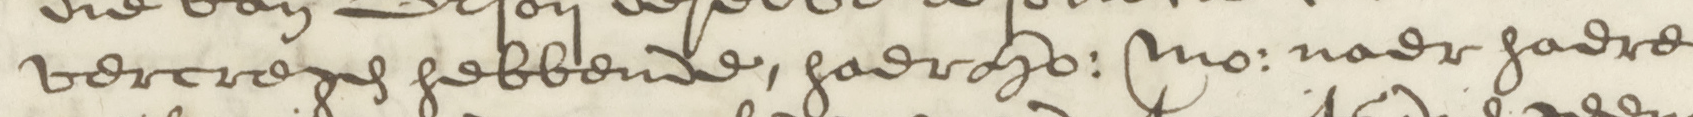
vercregen hebbende, haer Ho:Mo: naer haere
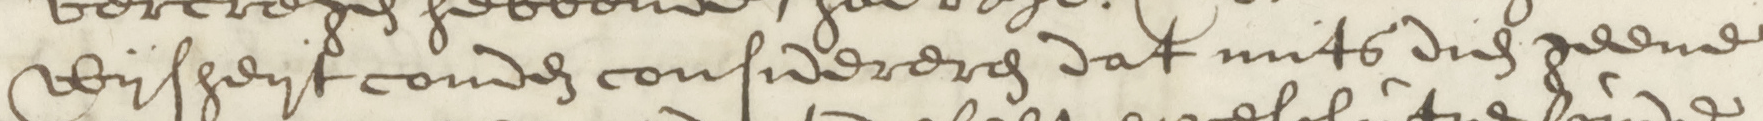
wijsheijt conden consideren dat mitsdien geene
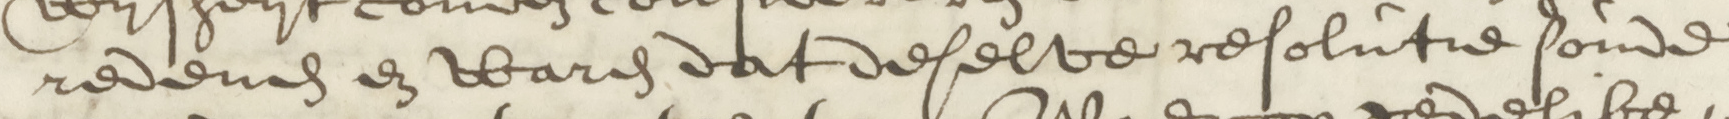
redenen en waren dat deselve resolutie soude
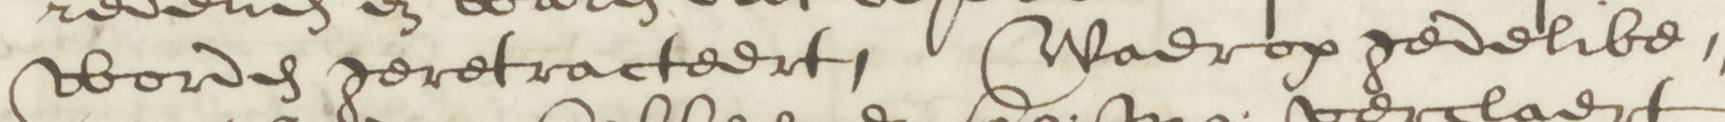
worden geretracteert. Waerop gedelibe„
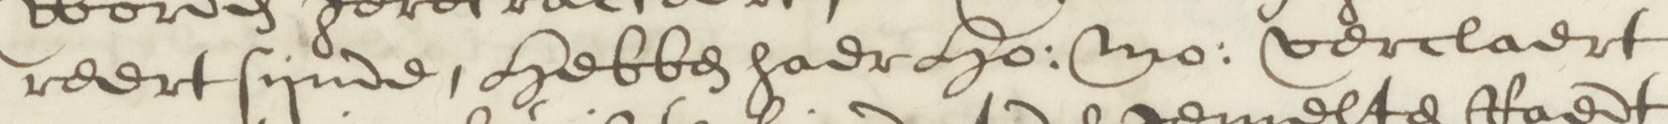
reert sijnde, hebben haer Ho:Mo: verclaert
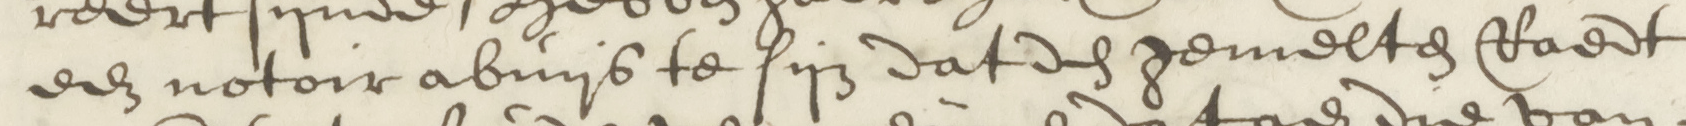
een notoir abuijs te sijn dat den gemelten Raedt
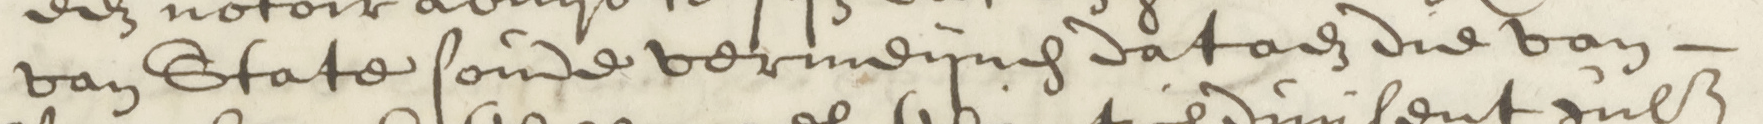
van State soude vermeijnen dat aen die van —
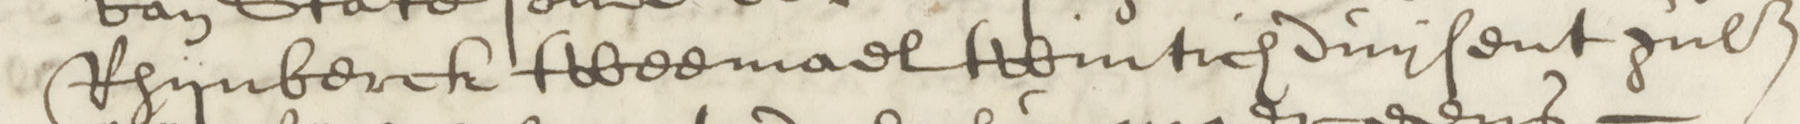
Rhijnberck tweemael twintich duijsent guls
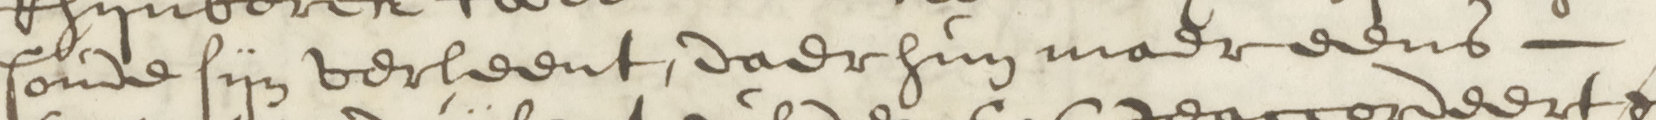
soude sijn verleent, daer hun maer eens —
